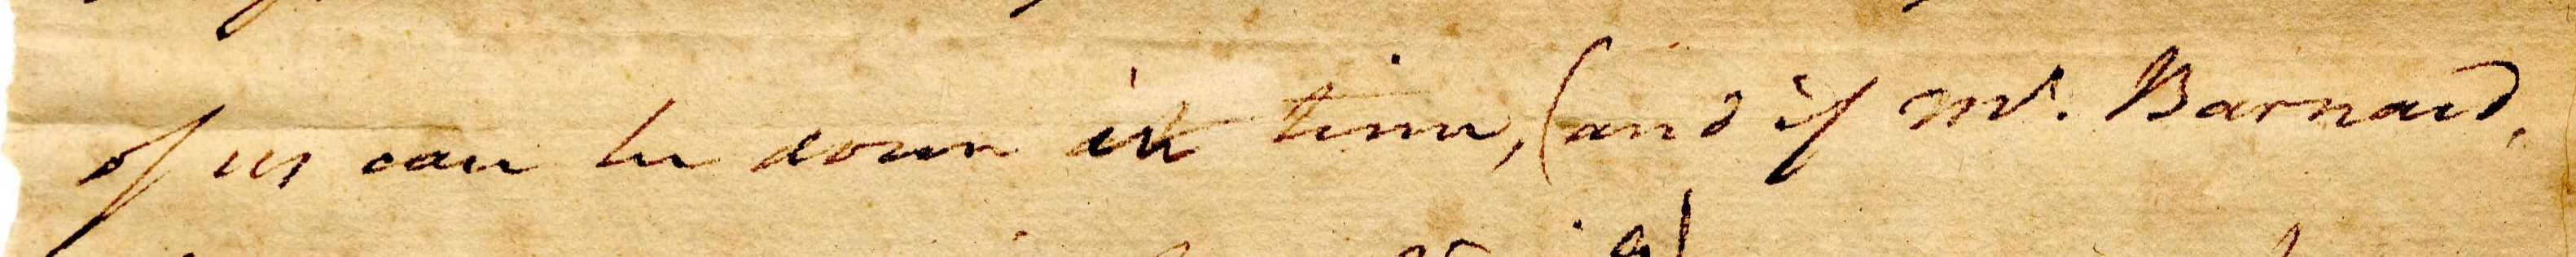of us can be down in time, (and if M^r. Barnard
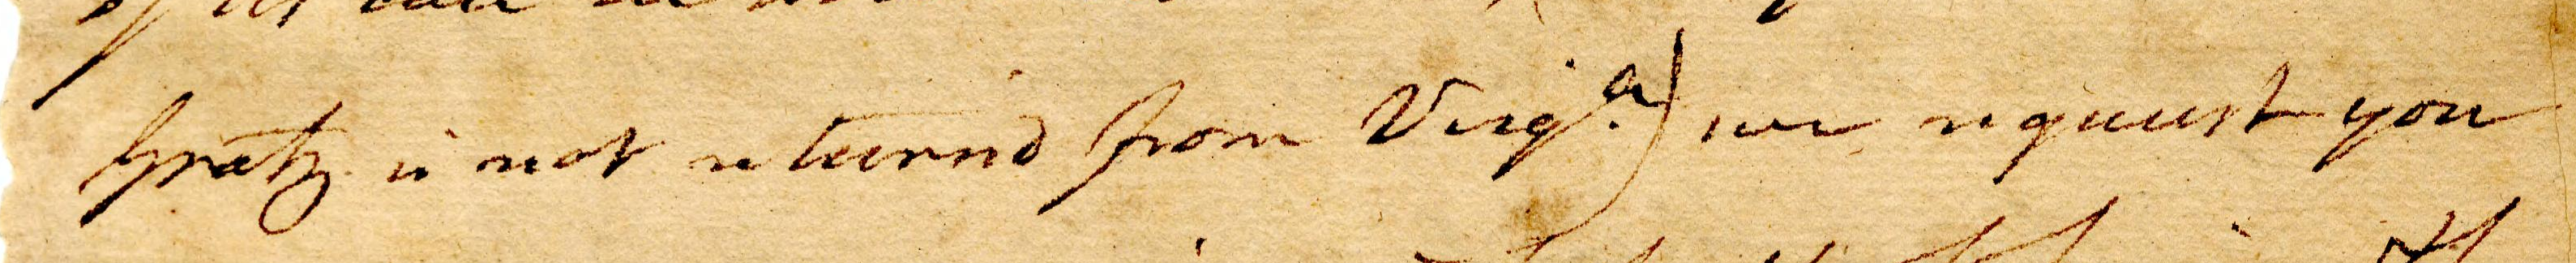Gratz is not return'd from Virg^a.) we request you
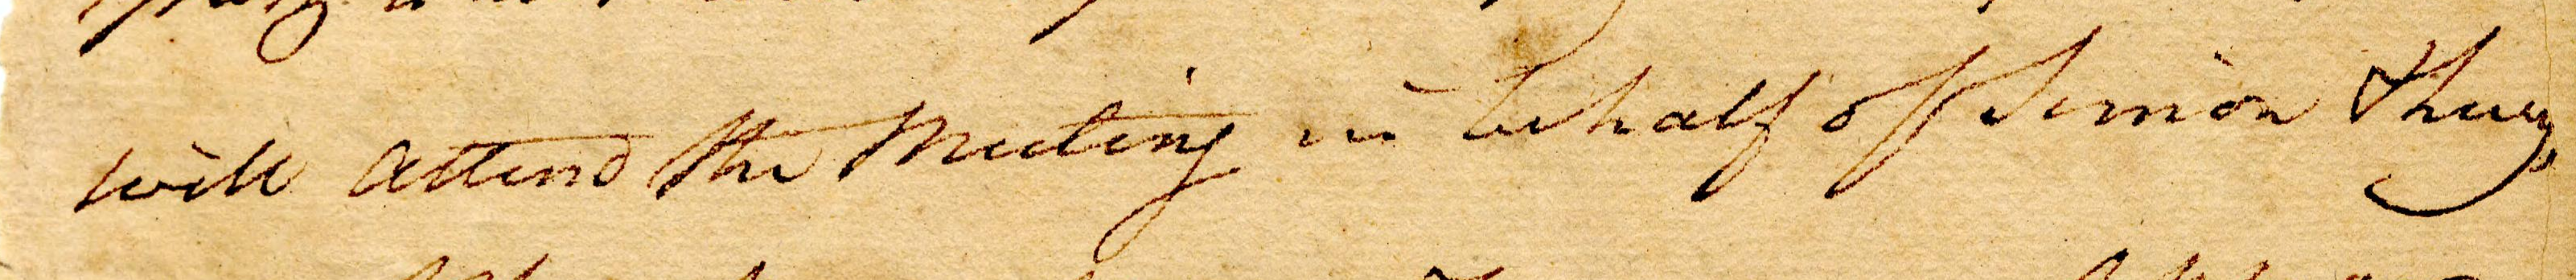will attend the meeting in behalf off Simon & Lucy,
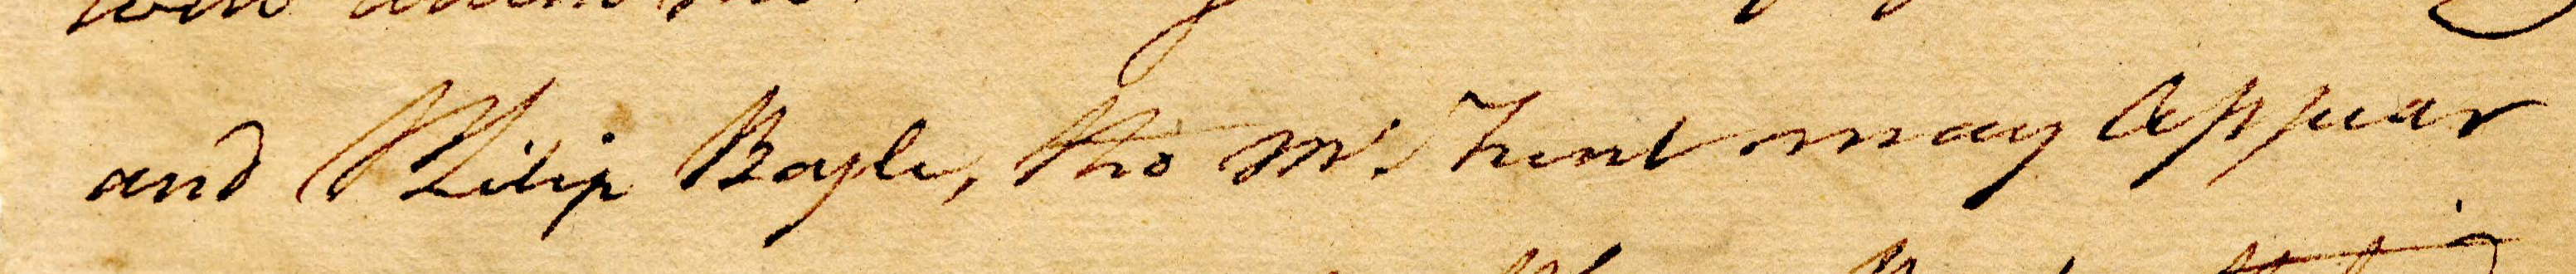and Philip Boyle, tho M^r. Hunt may appear
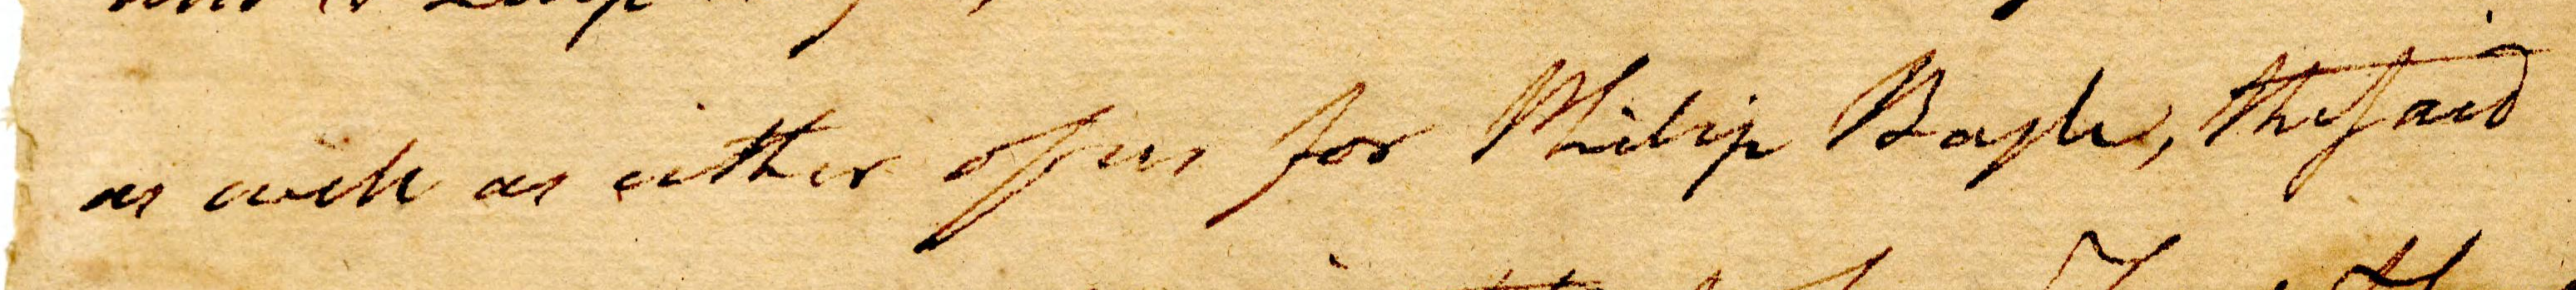as well as either offer for Philip Boyle, the said
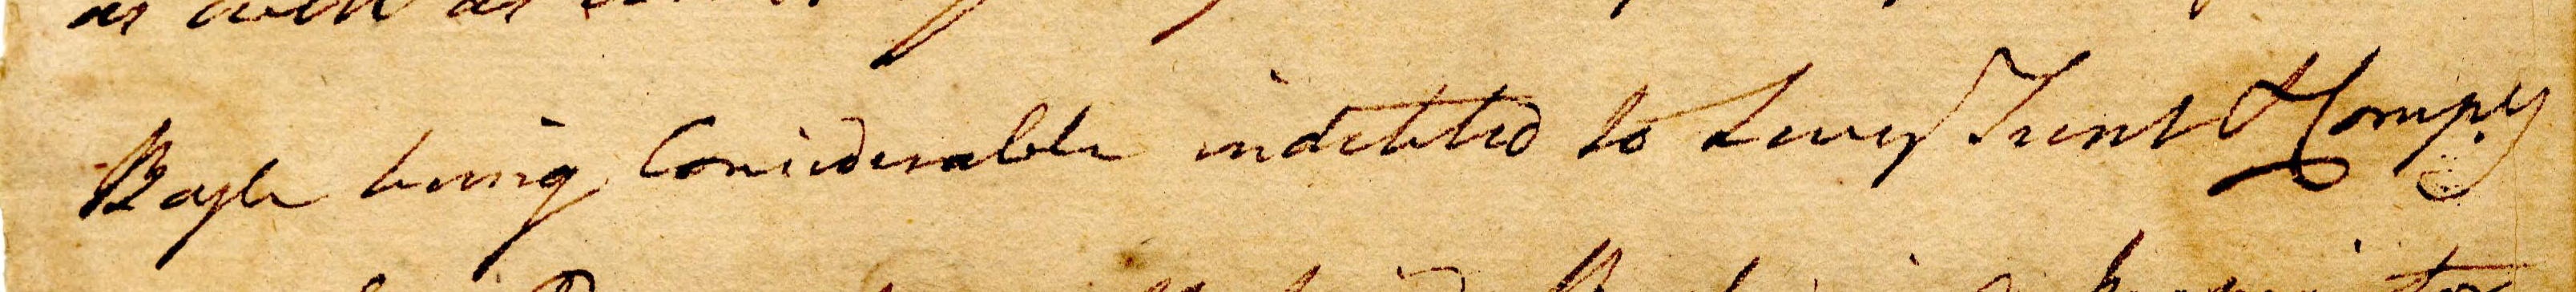Boyle being Considerable indebted to Lucy Trent & Comp^y
